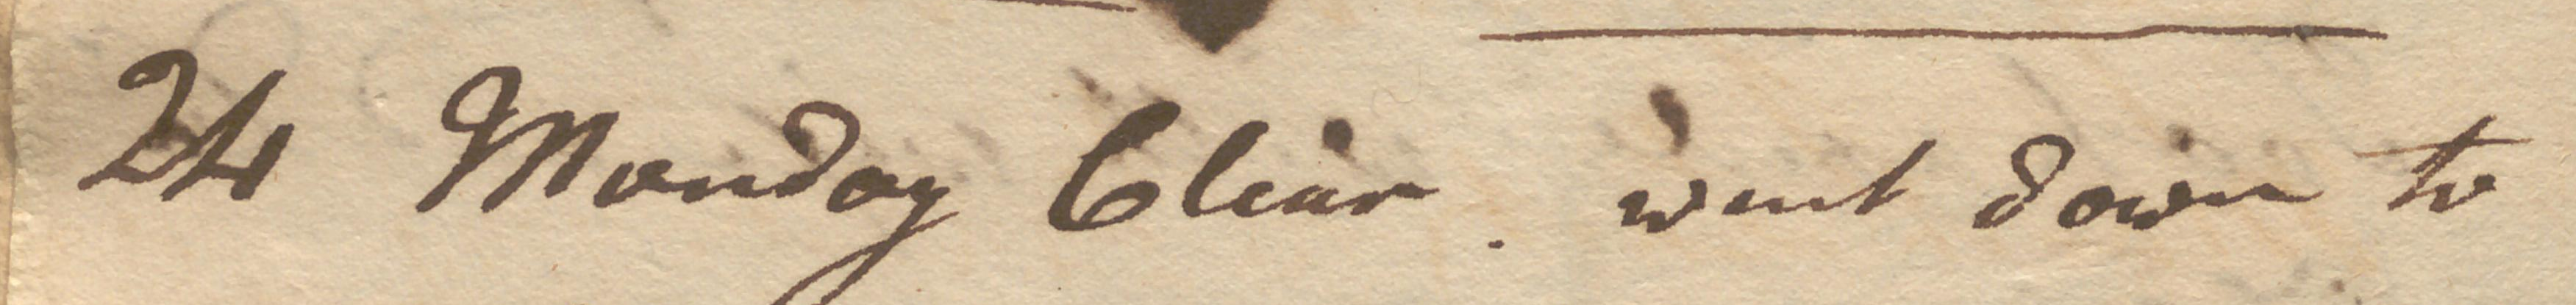24 Monday Clear went down to
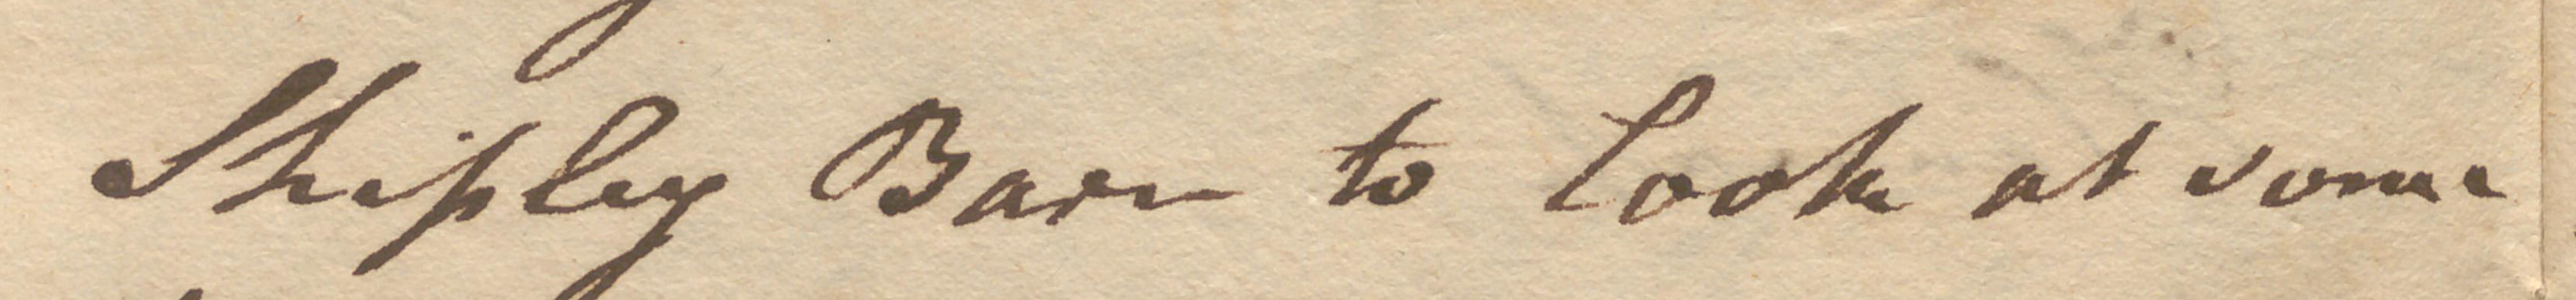Shipley Barn to look at some
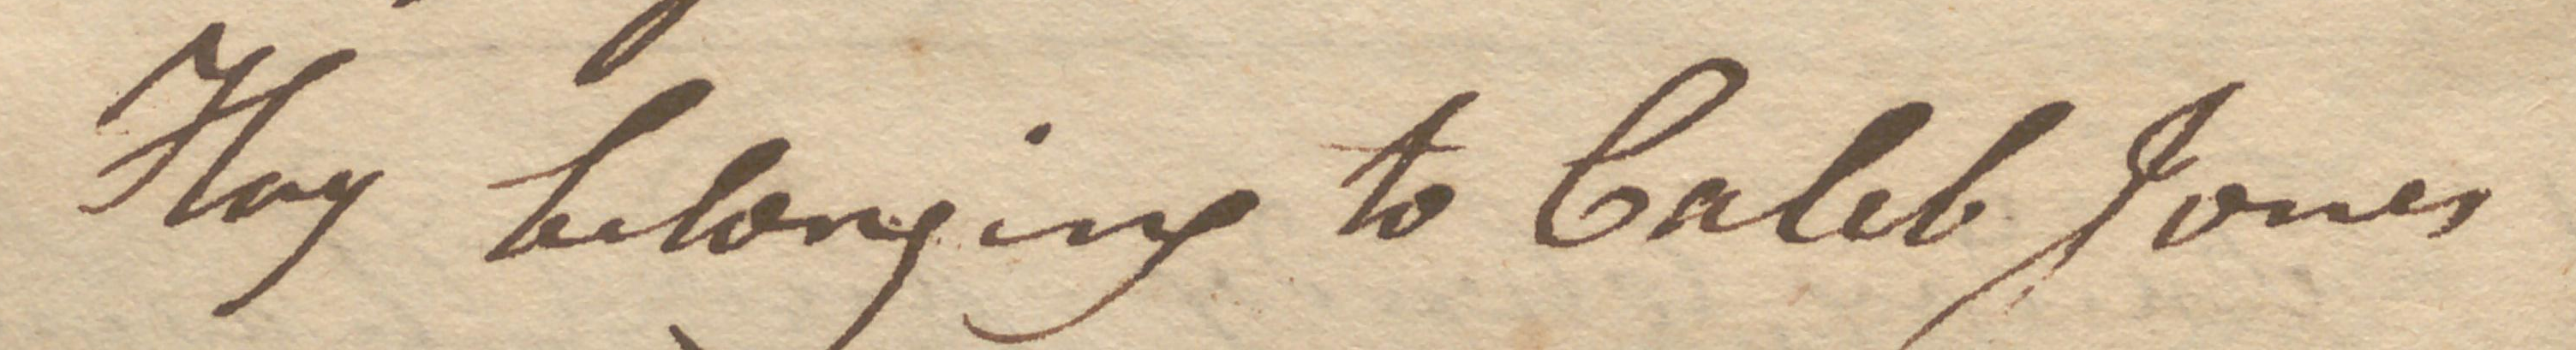Hay belonging to Caleb Jones
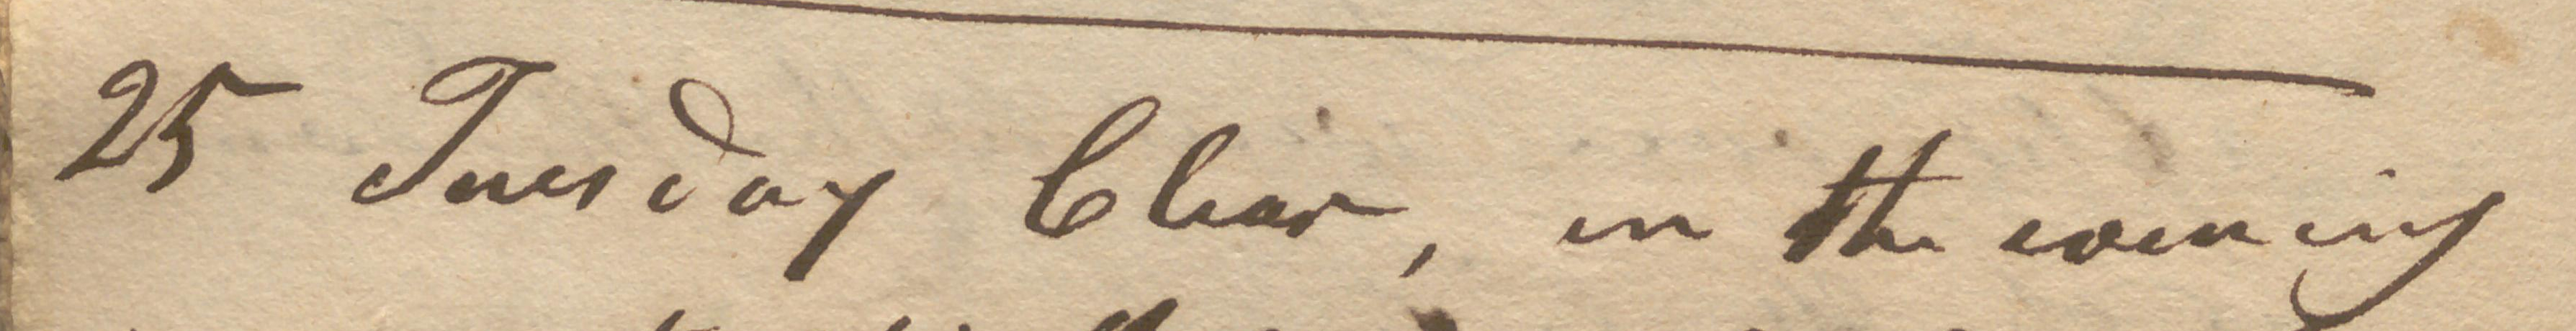25 Tuesday Clear in the evening
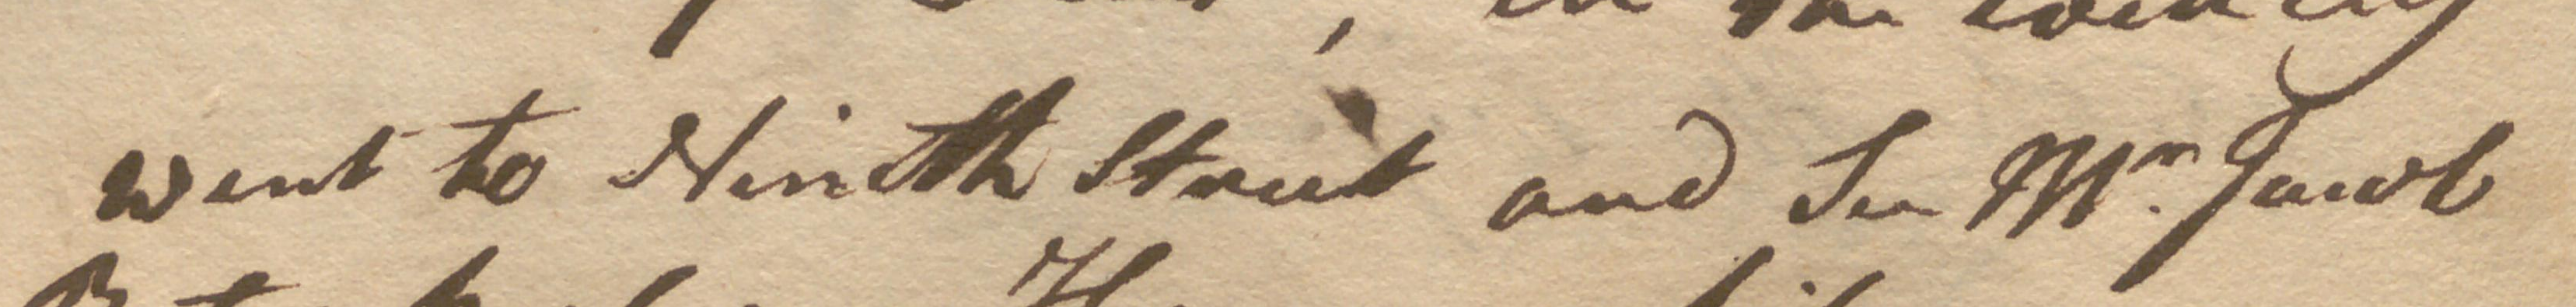went to Nineth Street and see M^r. Jacob
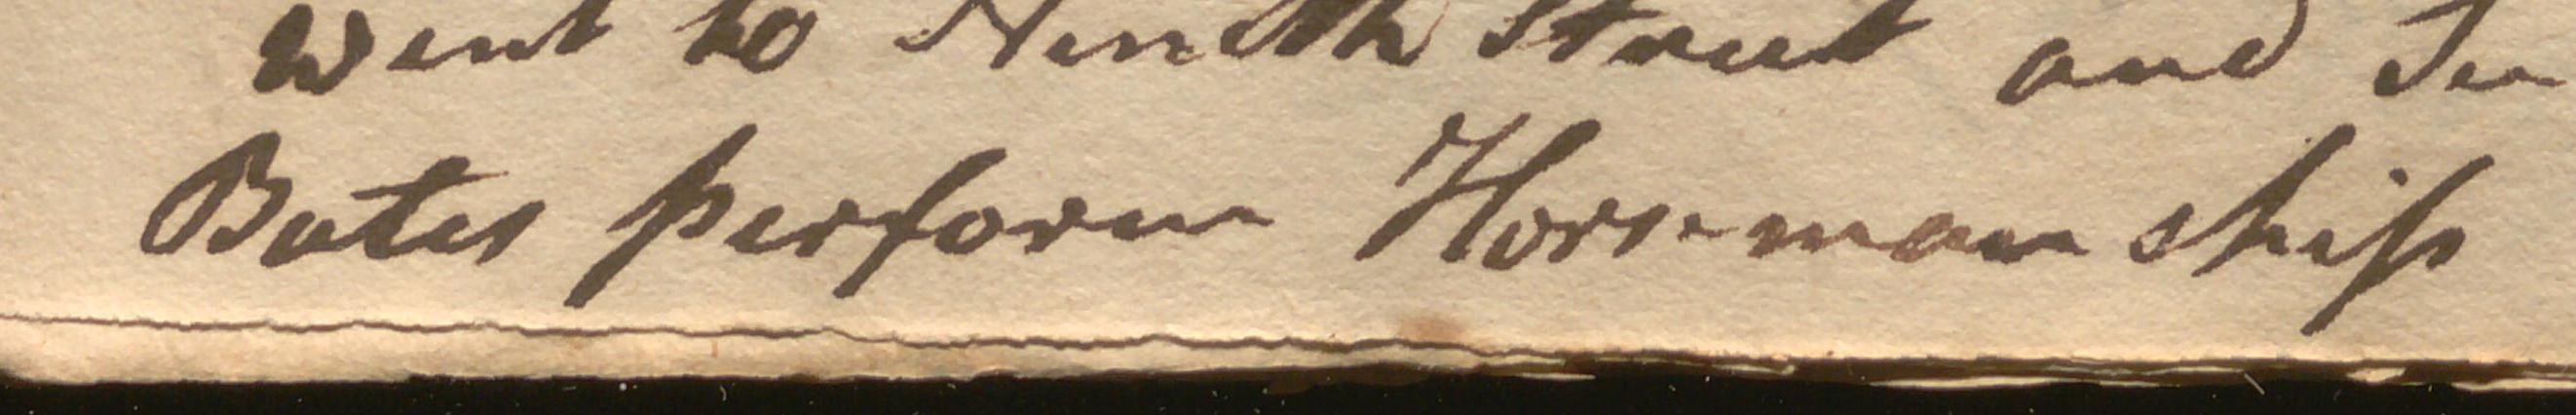Bates perforin Horseman ship
